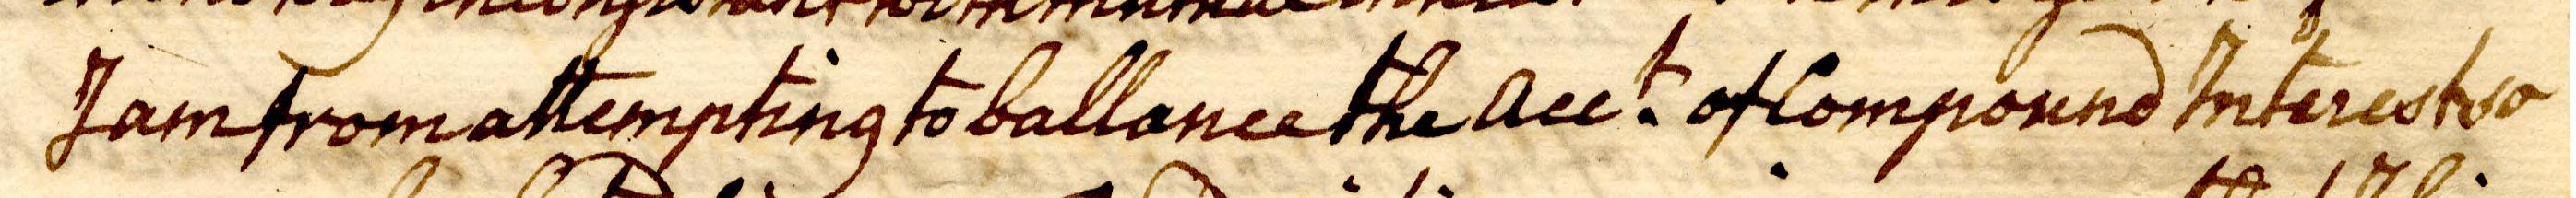I am from attempting to ballance the Acc^t. of Compound Interest so
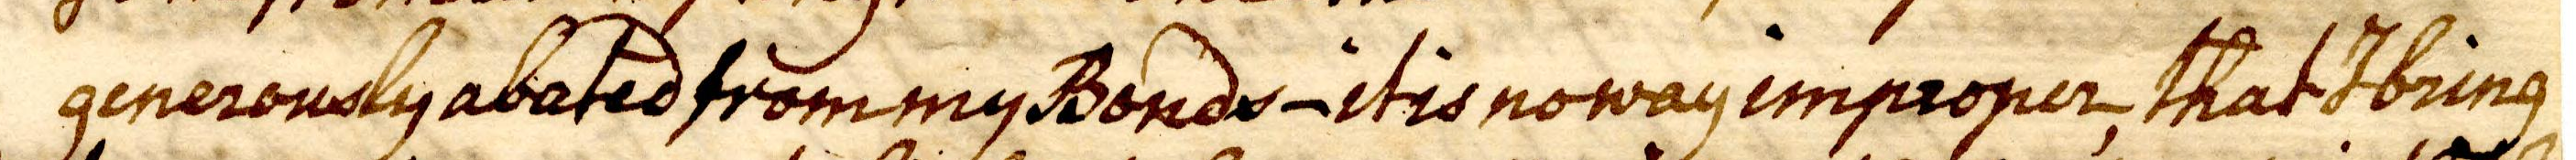generously abated from my Bonds- it is no way improper, that I bring
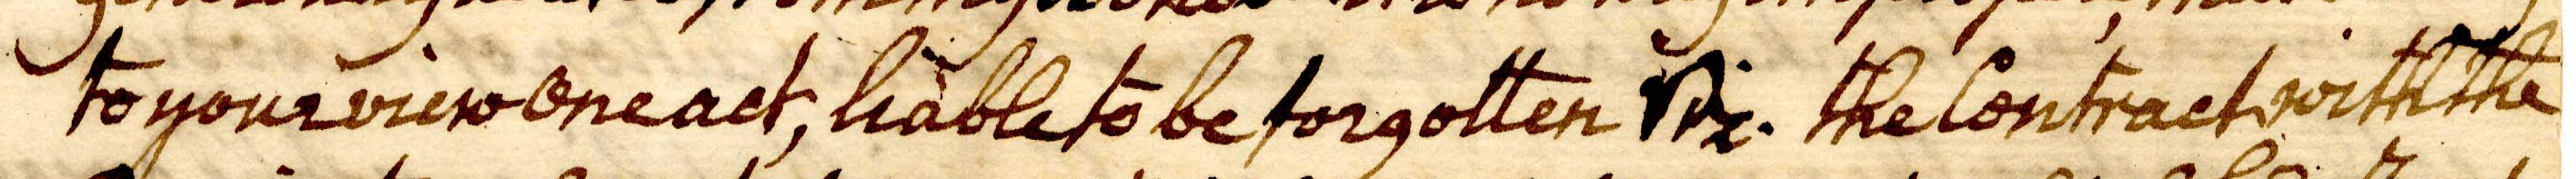to your view one act, liable so be forgotten Viz. the Contract with the
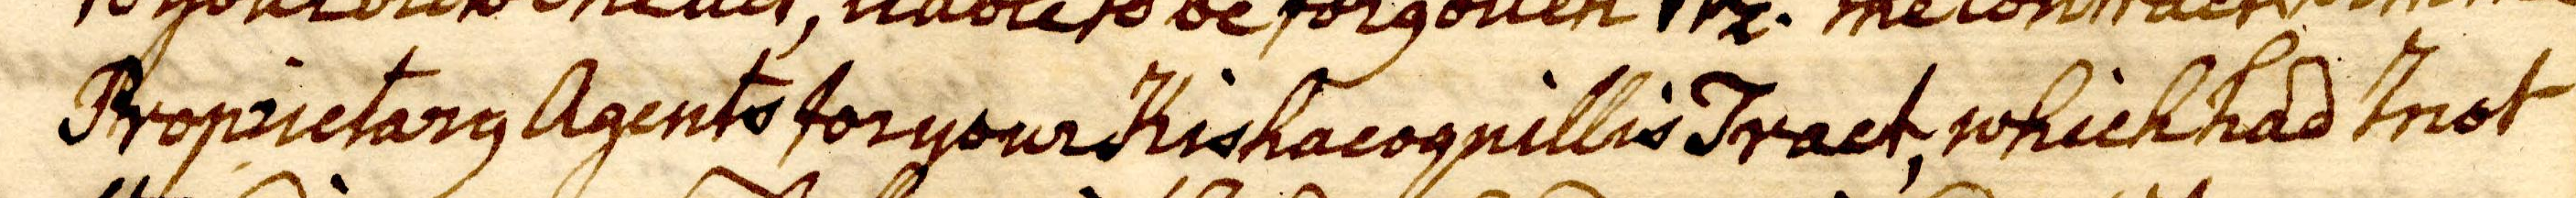Proprietary Agents for your Kishacoquillis Tract, which had I not
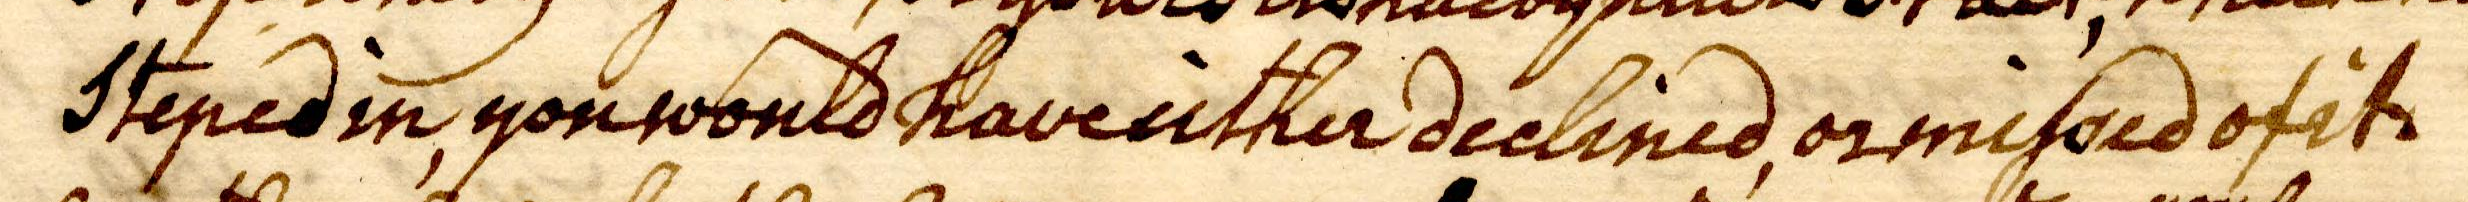Steped in, you would have either declined, or missed of it.
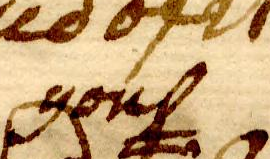you
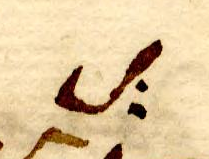J:
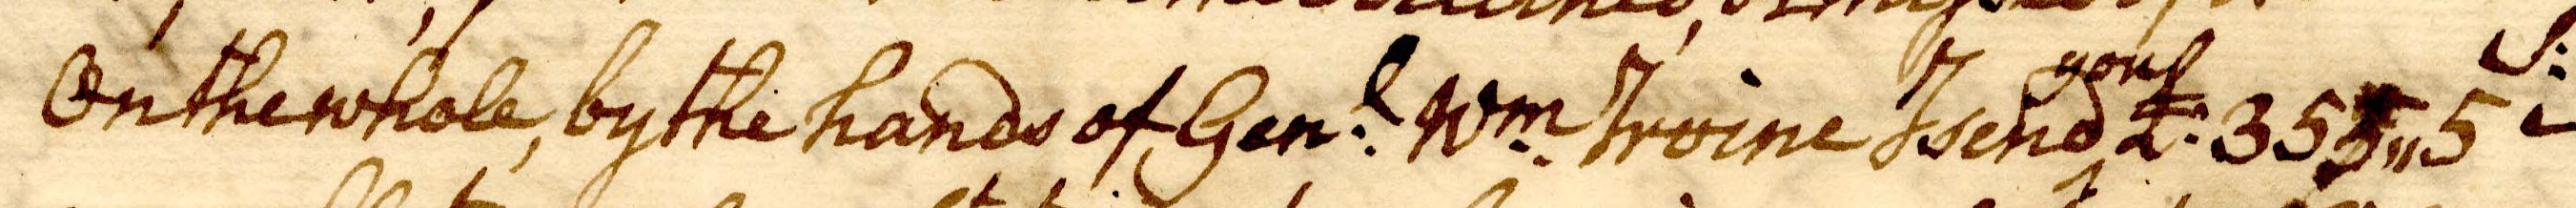On the whole, by the hands of Gen^l: W^m: Irvine I send £.355..5-
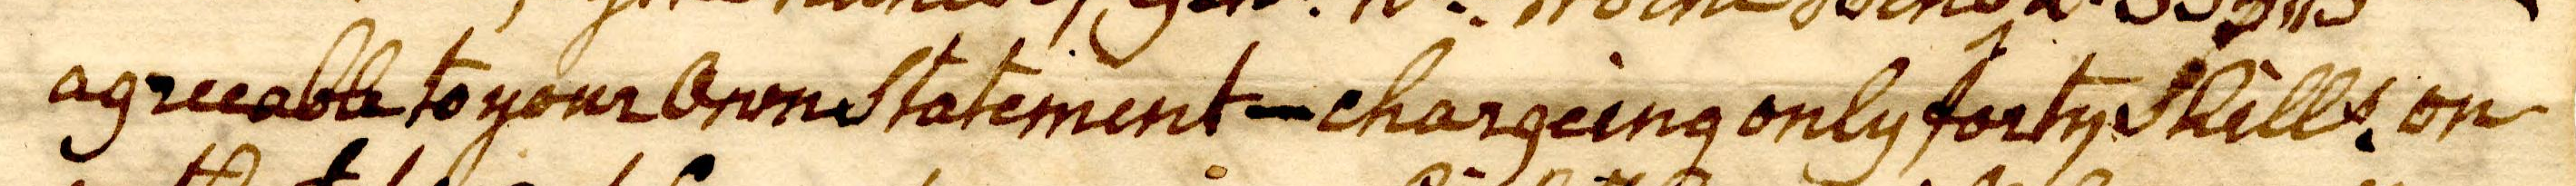agreeable to your Own Statement-chargeing only forty Shill^s. on
